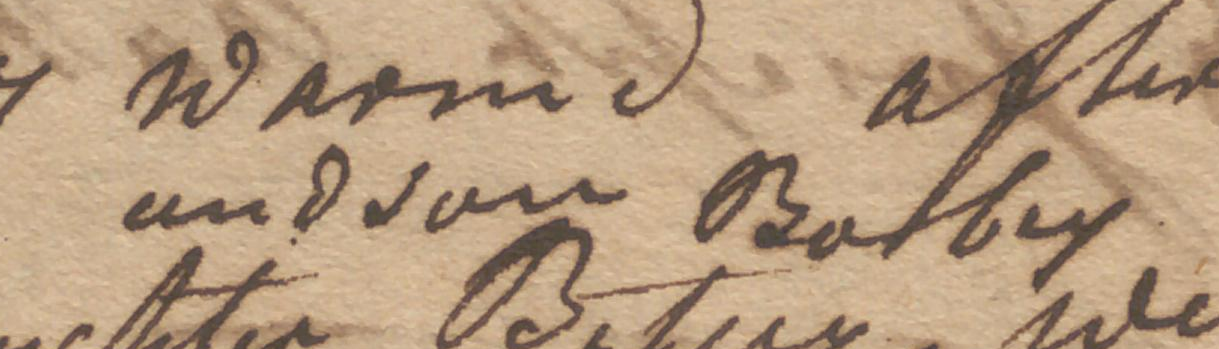and son Bobby
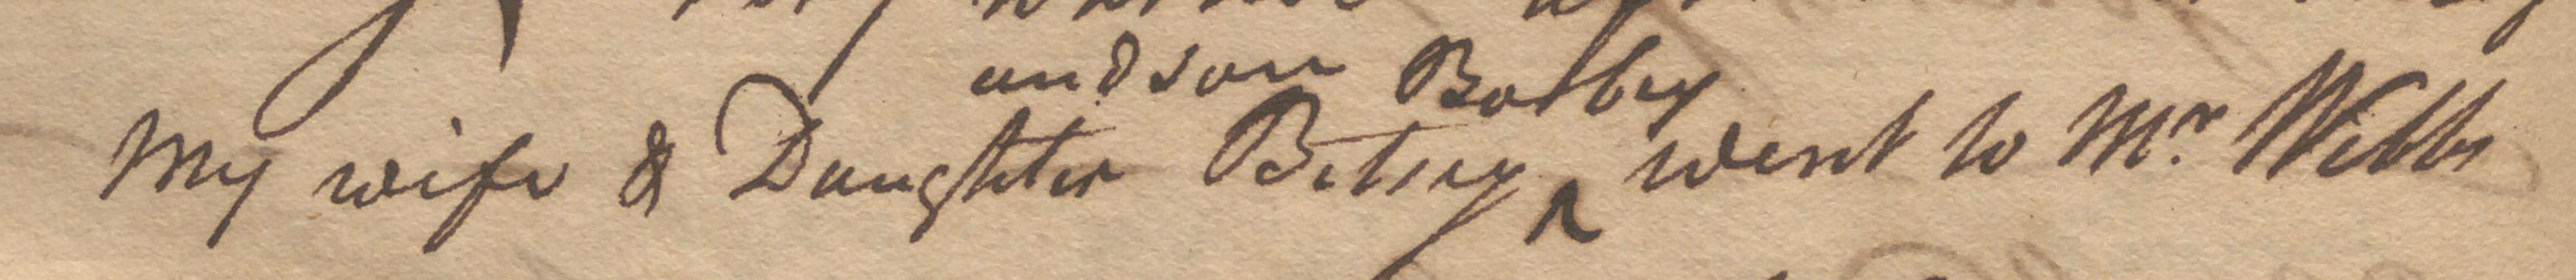My wife & Daughter Betsey ^ went to M^r. Webbs
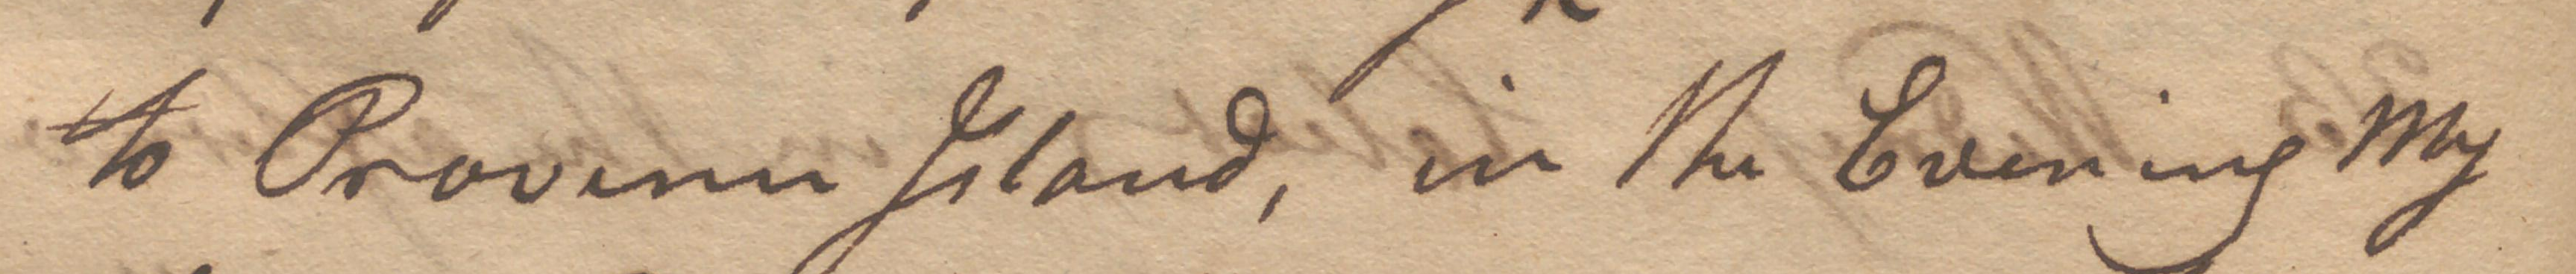to Province Island, in the Evening My
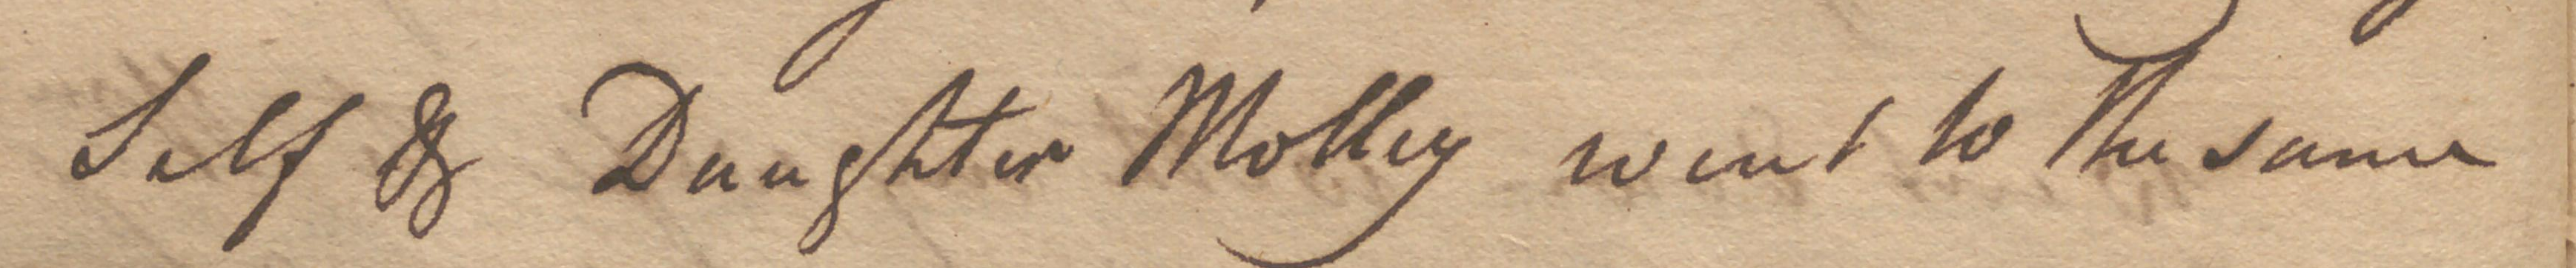Self & Daughter Molley went to the same
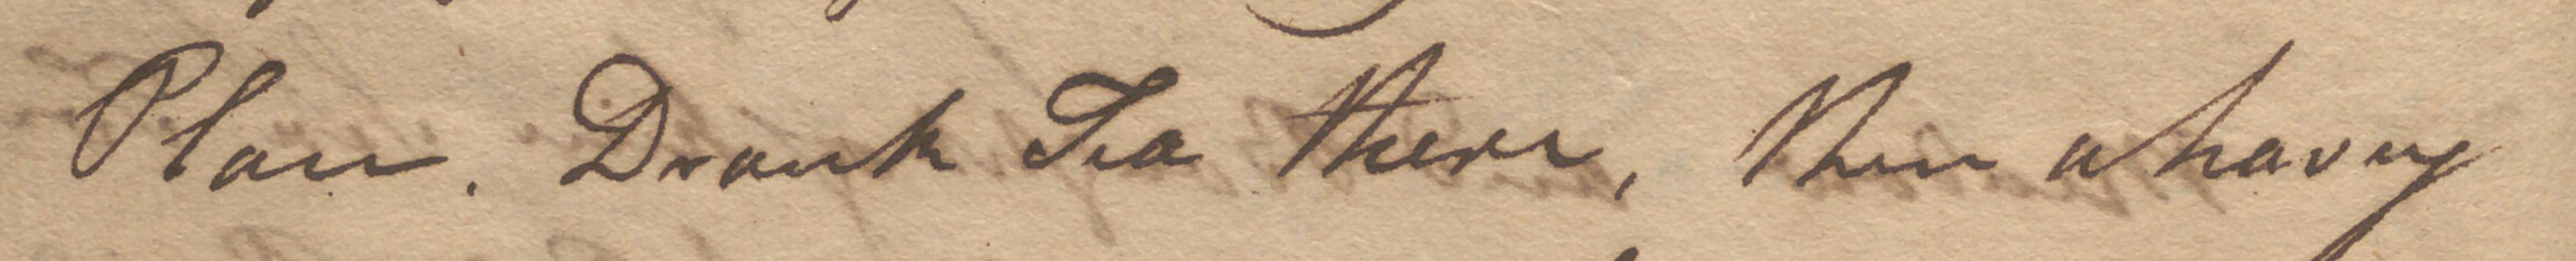Place. Drank Tea there, there a havey
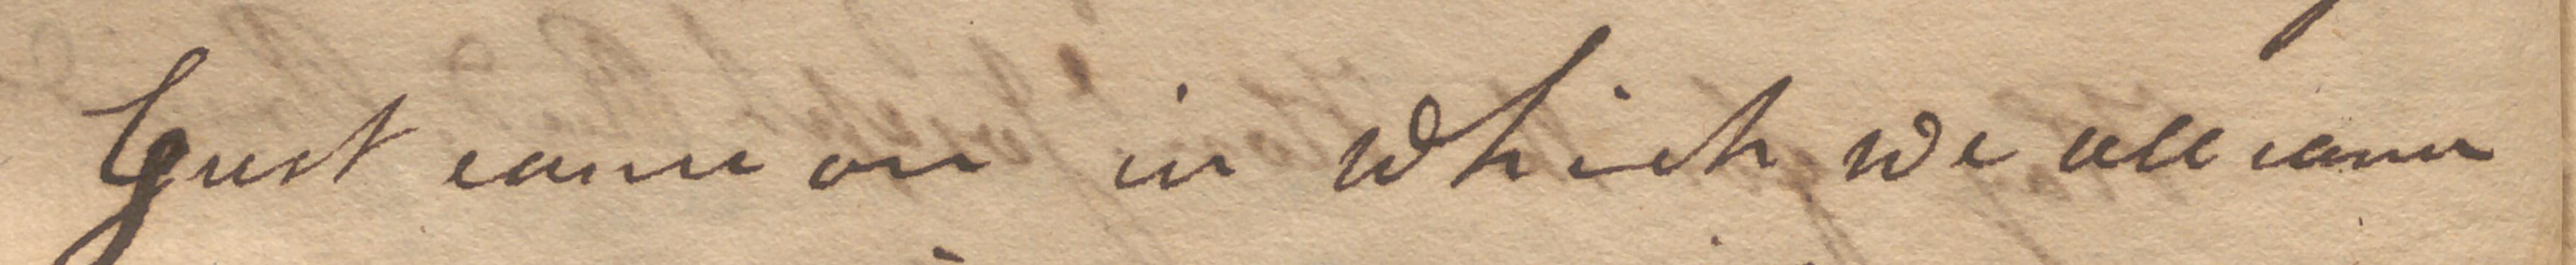Gust came on in which we all came
